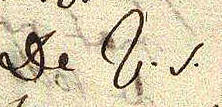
De V. s.
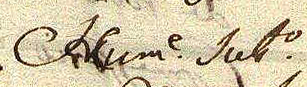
Hum.e sub̄.to
